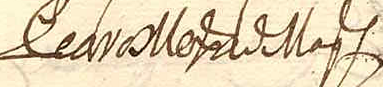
Pedro Mex̄ de Mages
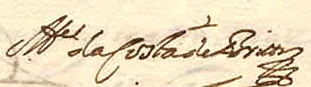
Mel da Costa de Britto
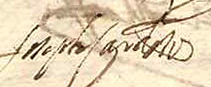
Joseph Cardoso
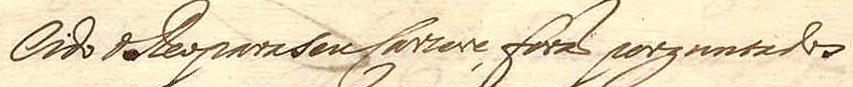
E ido o Reo para seu Carcere, forā perguntados
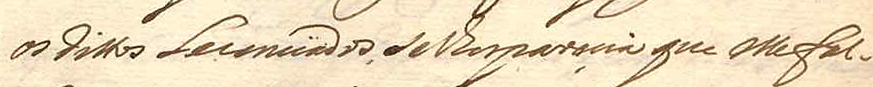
os dittos Lecenciados se lhes parecia que elle fal
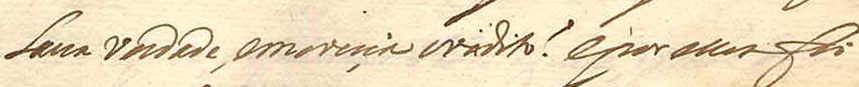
laua verdade, e merecia credito? E por elles foi
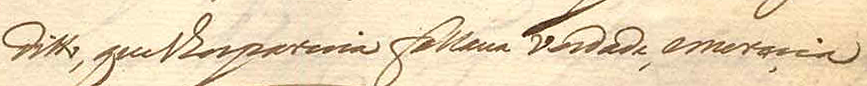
ditto, que lhes parecia fallaua verdade, e merecia
